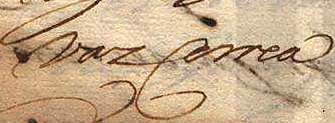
Vaz Correa
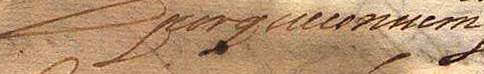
E porque conuem
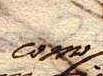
como
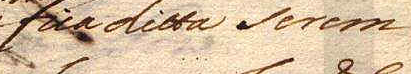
fica ditta serem
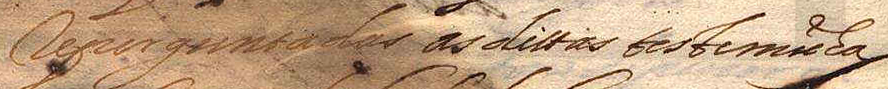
Reperguntadas as dittas testemūhas
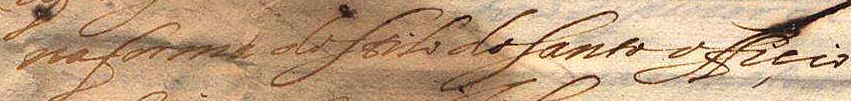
na forma do Stilo do santo officio
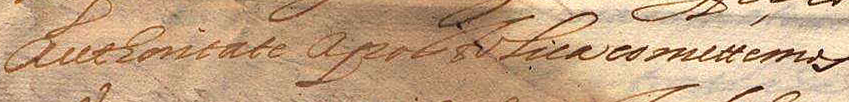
authoritate apostolica comettemos
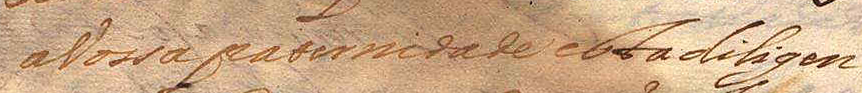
a Vossa paternidade esta diligen
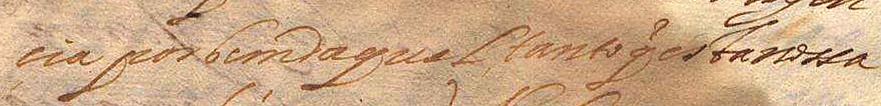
cia por bem da qual, tanto q̄ esta nossa
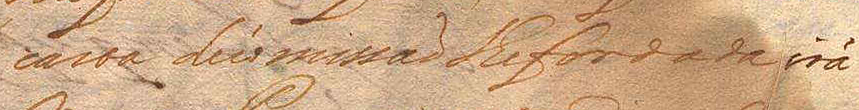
carta de cōmissaõ lhe for dada irá
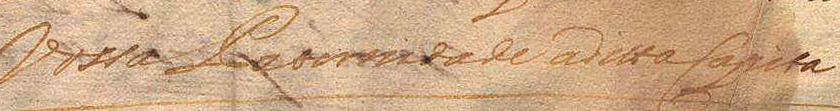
Vossa Paternidade a ditta Capita
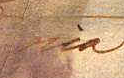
nia
